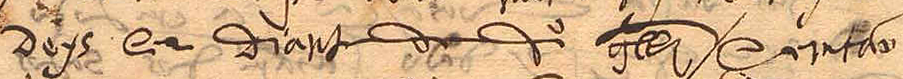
deys ler diante de do ḡllz / e emtão
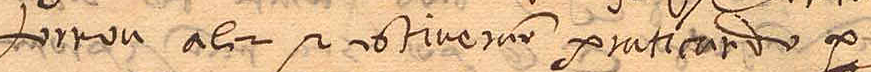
tornou a ler e estiuerão praticando ꝑ
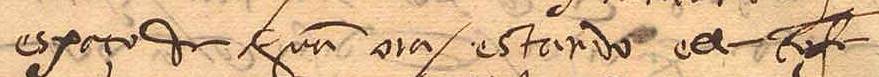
espaço de hūa ora / estando elle cōfe
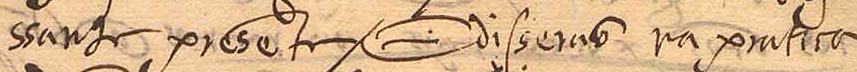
ssante presēte / E disseraõ na pratica
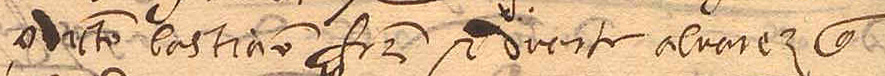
o dic̄to bastiaõ fr̄z e duarte aluarez q̄
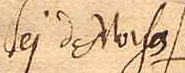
lej de Moises /
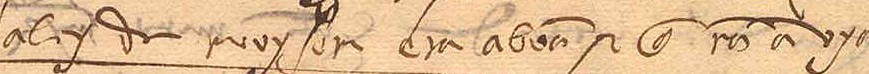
a ley de moysem era a bōa e q̄ nā avya
